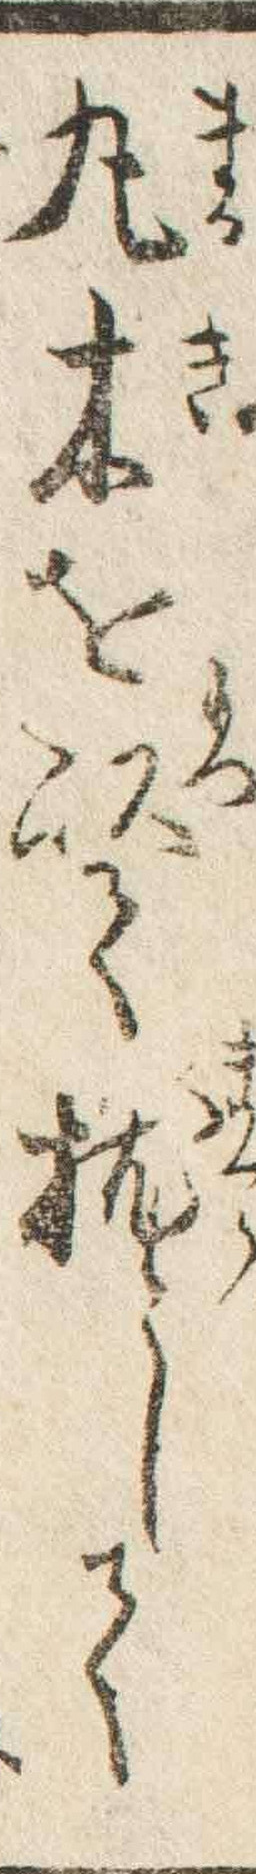丸木を以て枕として
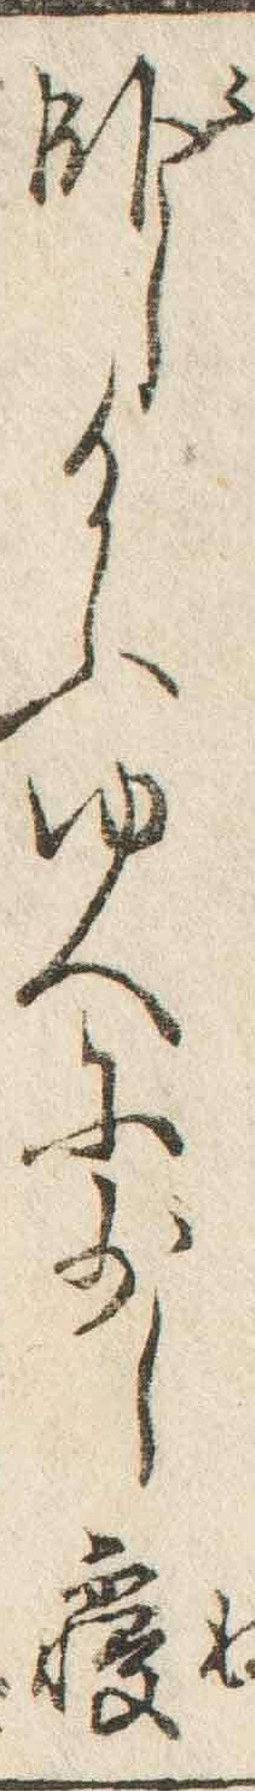臥し給ふゆへに少し寝
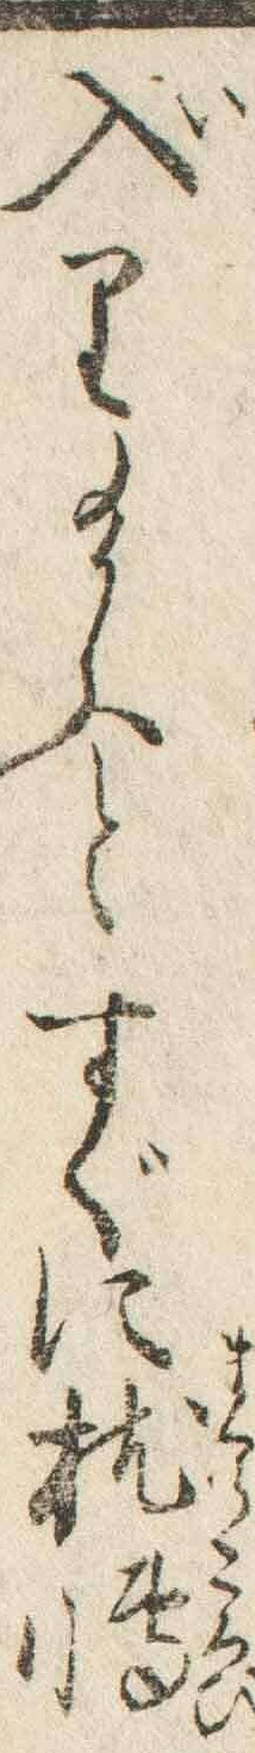入り給ふとすぐに枕転
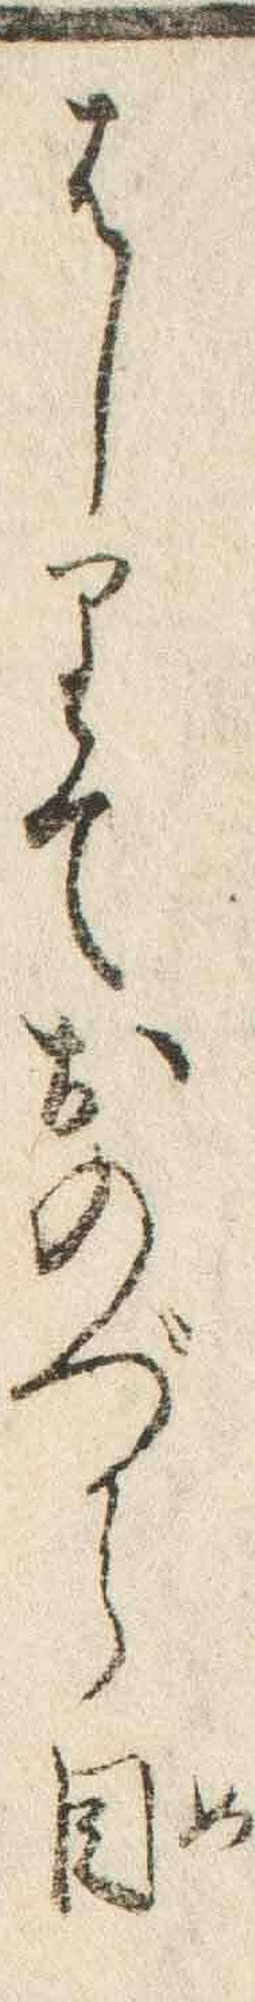はしりておのづから目
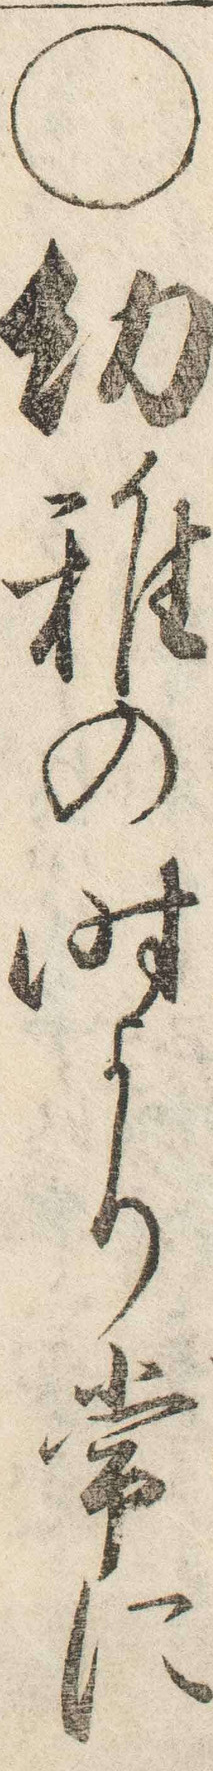〇幼稚の時より常に
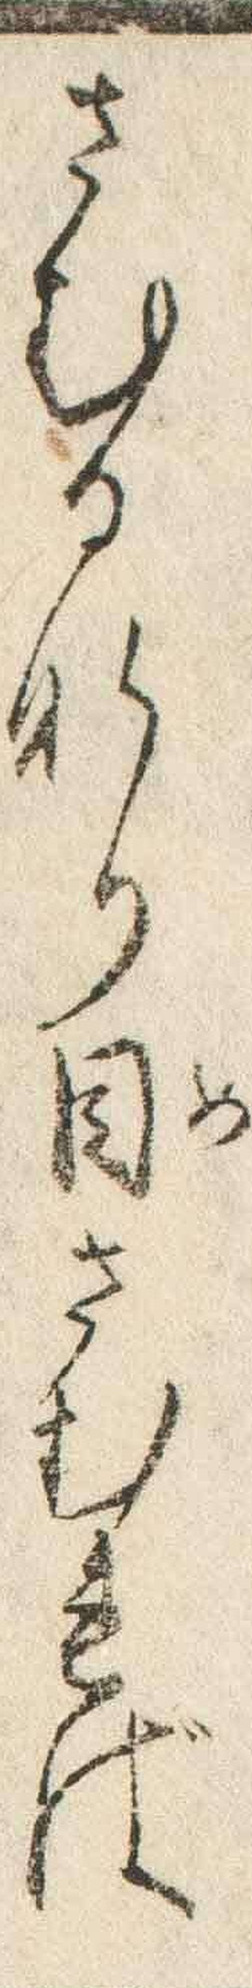さむるなり目さむれば
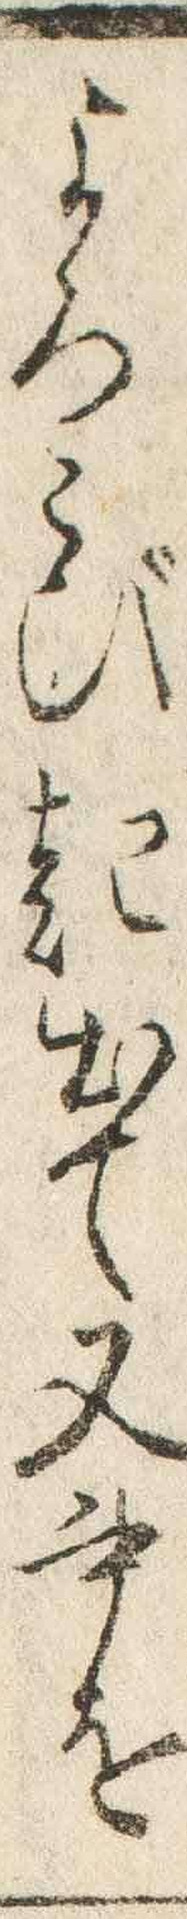よろこび起出て又書を
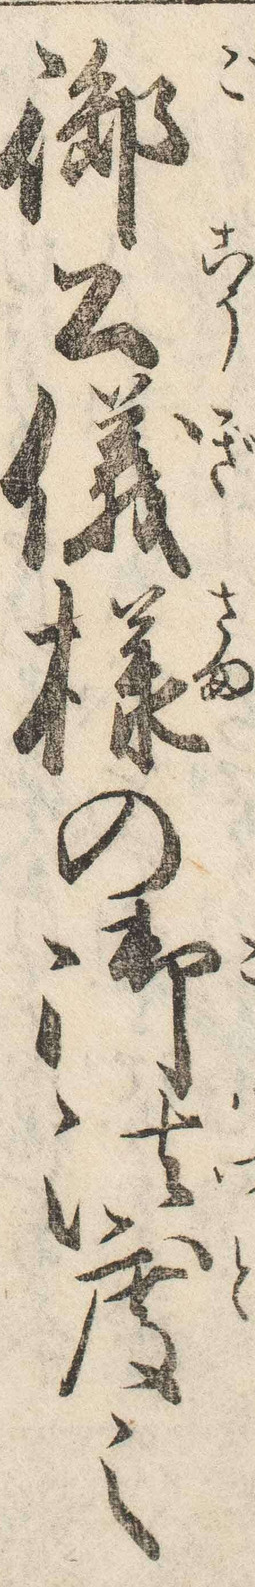御公儀様の御法度之
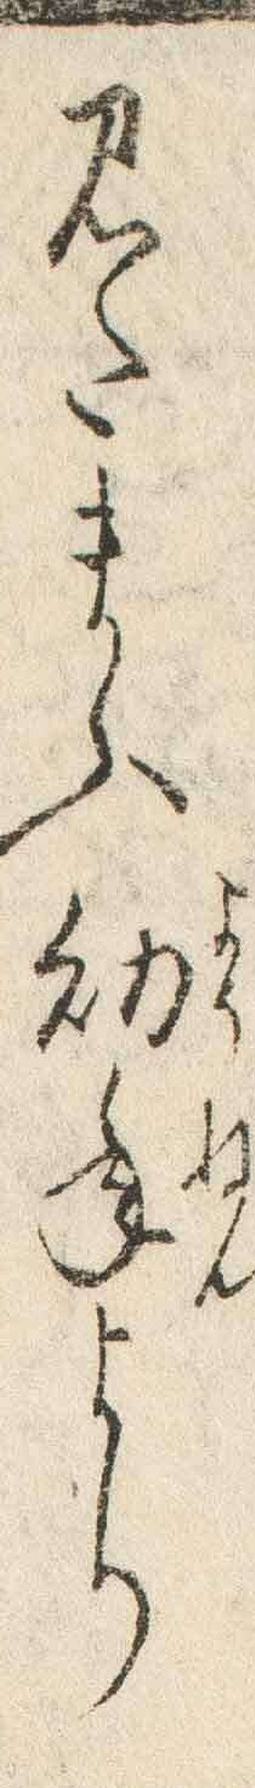見たまふ幼年より
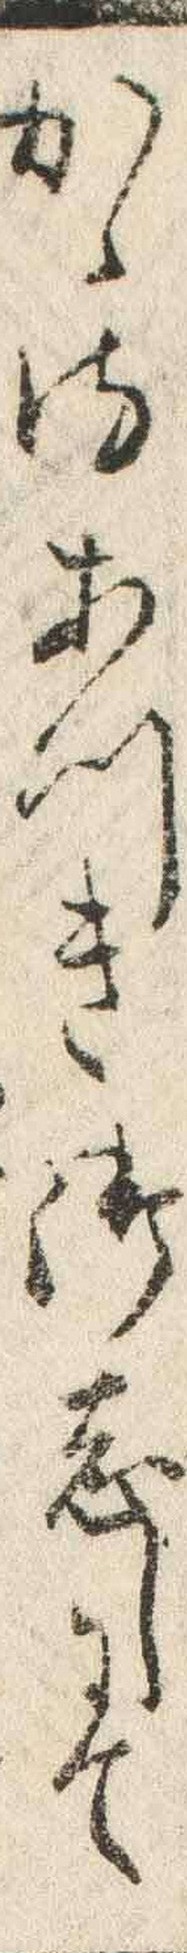かゝるあつき御志しにて
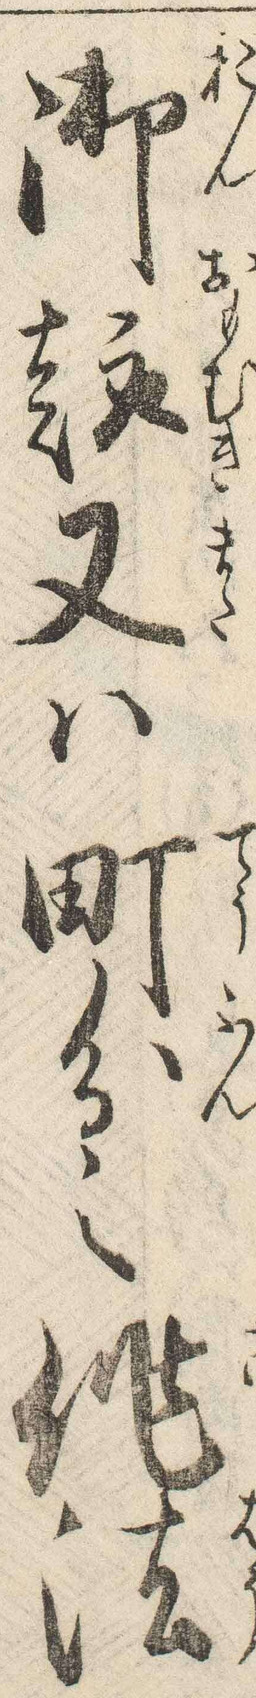御趣又は町分之作法
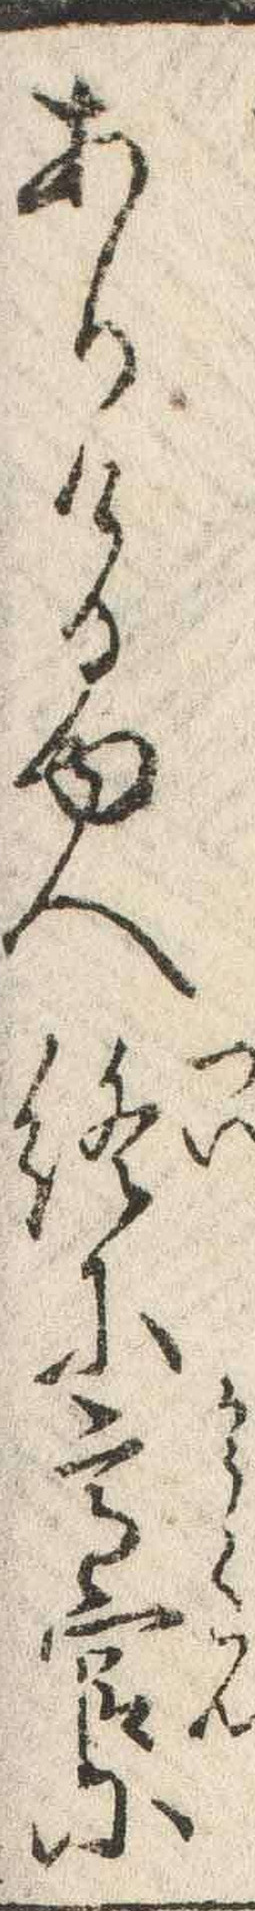ありけるゆへ終に高官に
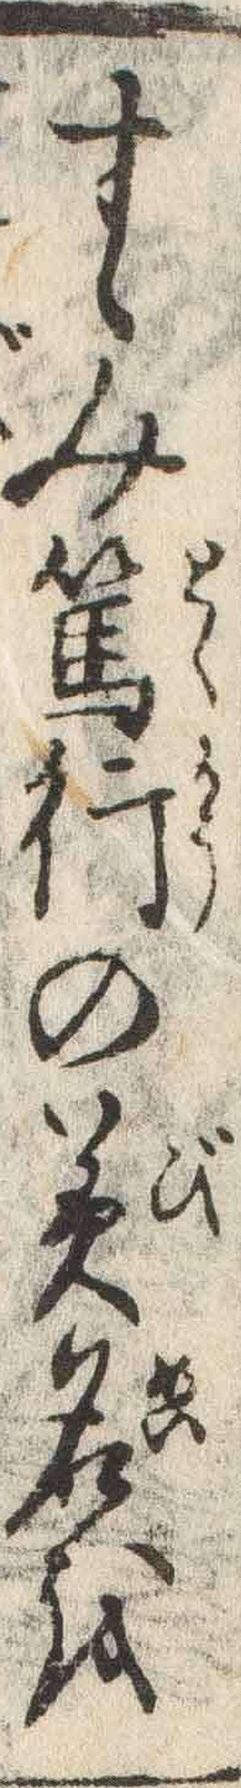すゝみ篤行の美名を
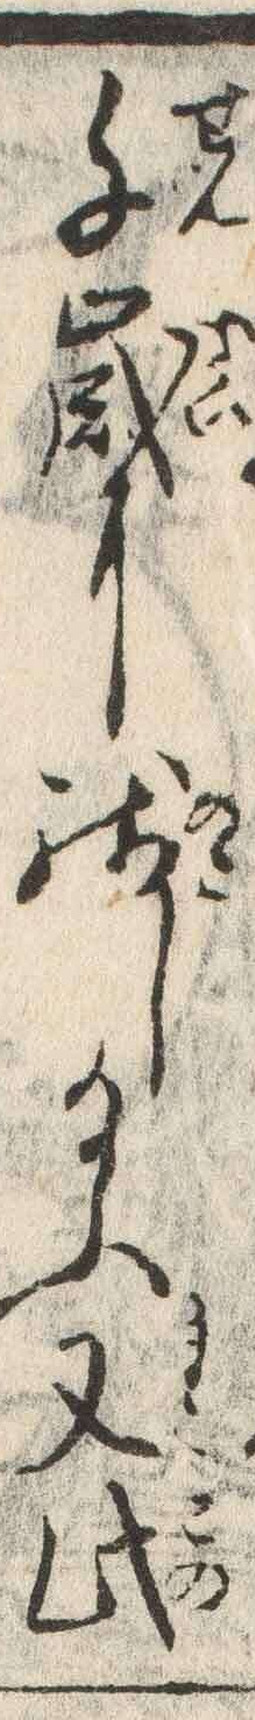千歳に残し給ふ又此
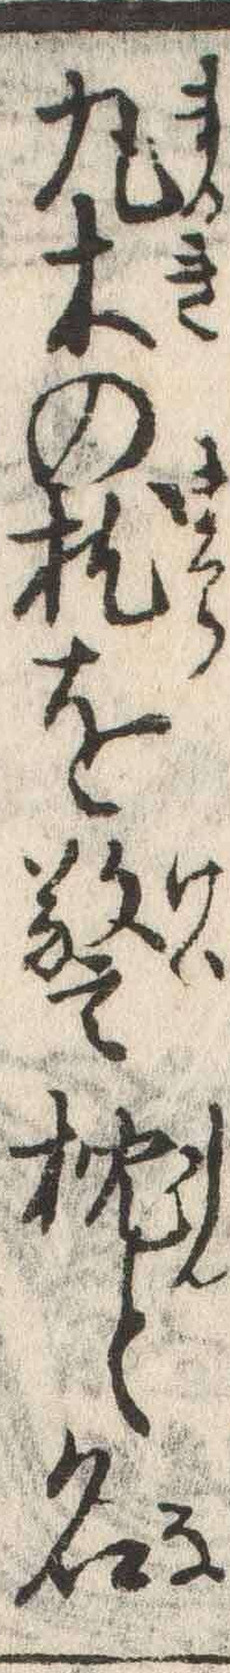丸木の枕を警枕と名
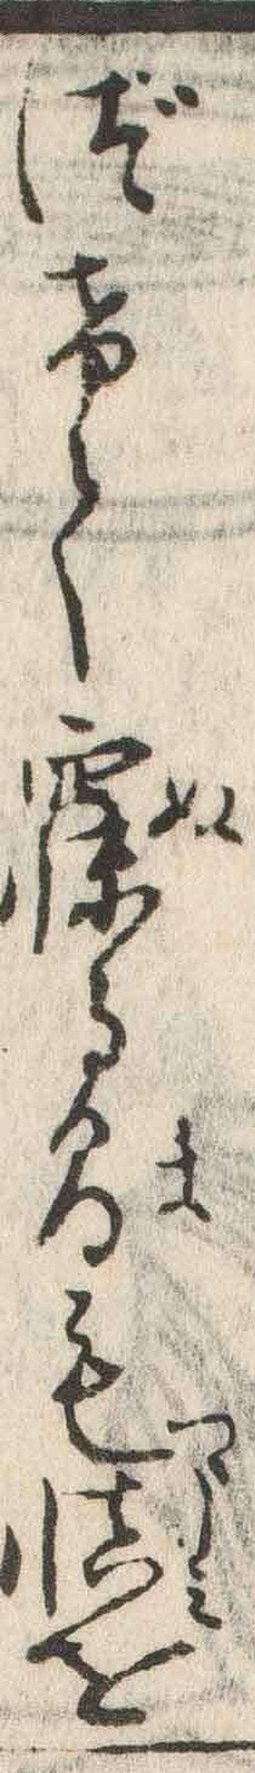づけて寝る間も慎を
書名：撫育草
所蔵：東京学芸大学附属図書館 国文学研究資料館
